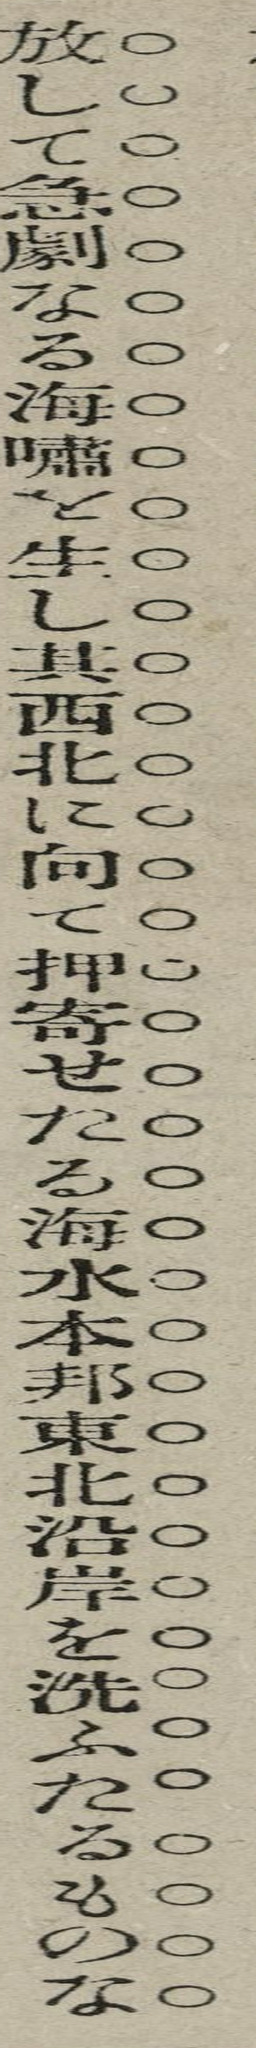放して急劇なる海嘯を生し其西北に向て押寄せたる海水本東北沿岸を洗ふたるものな
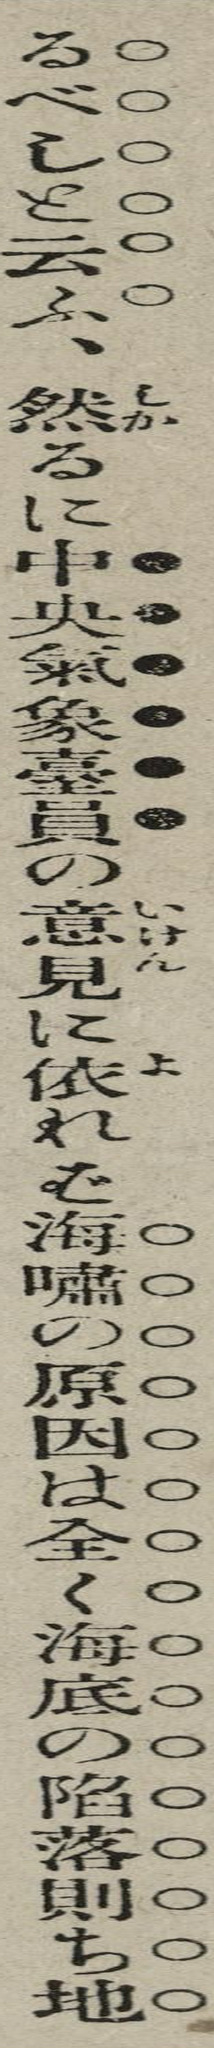るべしと云ふ、然るに中央氣象臺員の意見に依れば海嘯の原因は全く海底の陥落則ち地
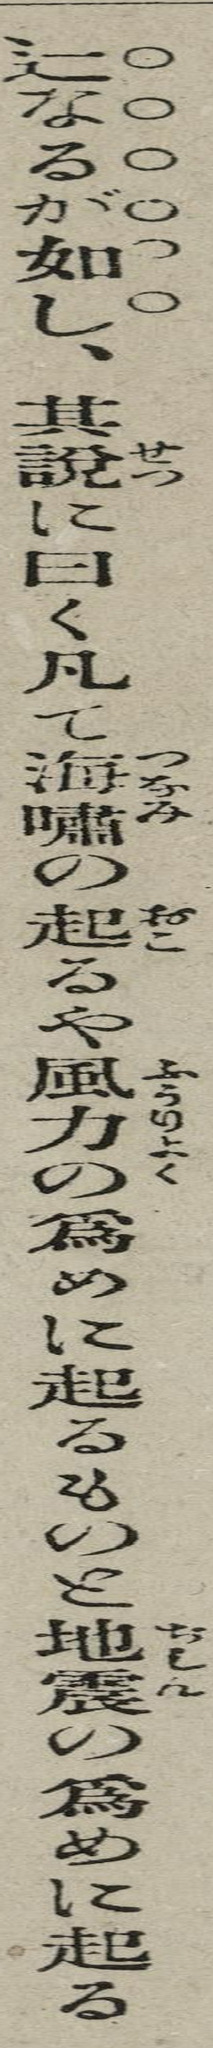辷なるが如し、其説に曰く凡て海嘯の起るや風力の爲めに起るものと地震の爲めに起る
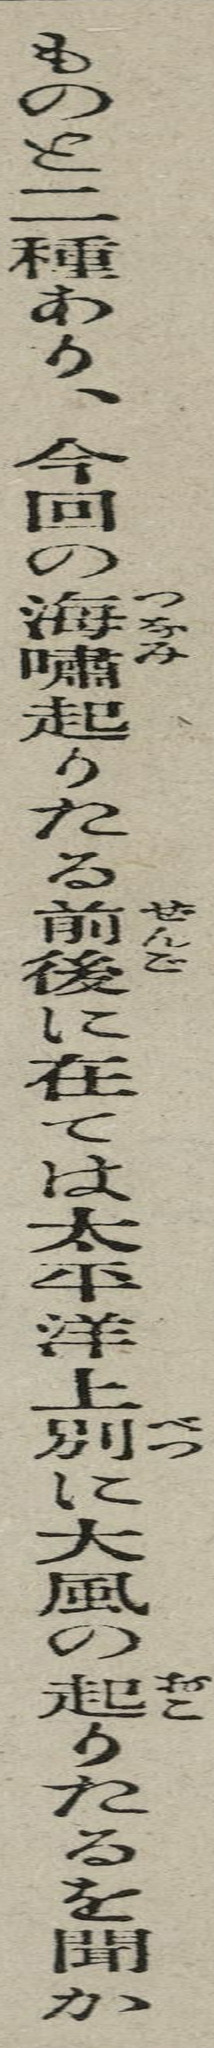ものと二種あり、今回の海嘯起りたる前後に在ては太平洋上別に大風の起りたるを聞か
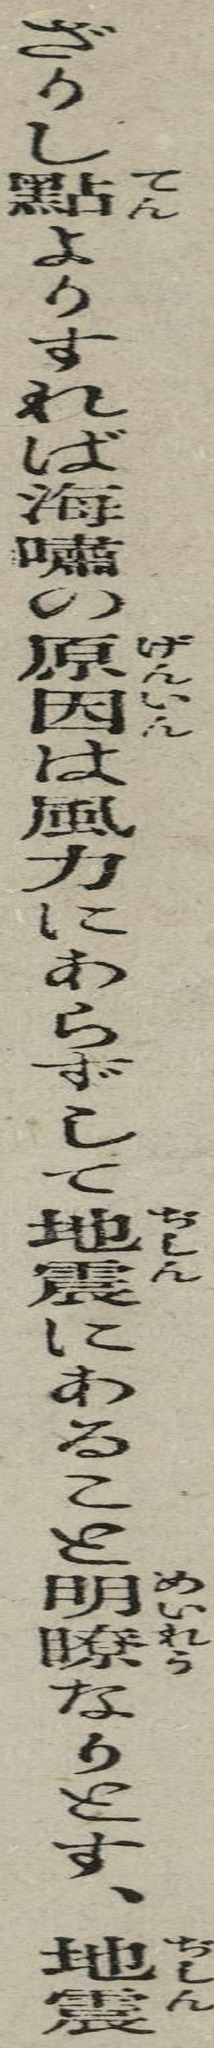ざりし點よりすれば海嘯の原因は風力にあらずして地震にあること明瞭なりとす、地震
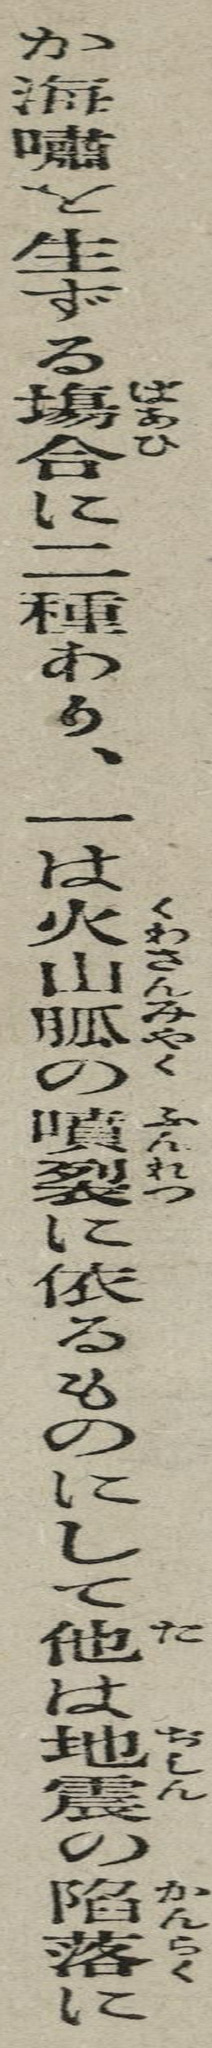か海嘯を生ずる塲合に二種あり、一は火山胍の噴裂に依るものにして他は地震の陥落に
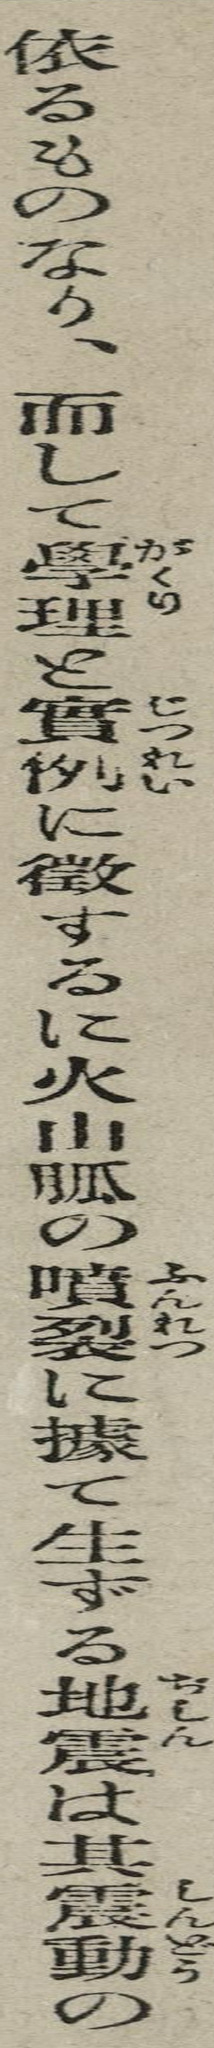依るものなり、而して學理と實例に徴するに火山胍の噴裂に據て生ずる地震は其震動の
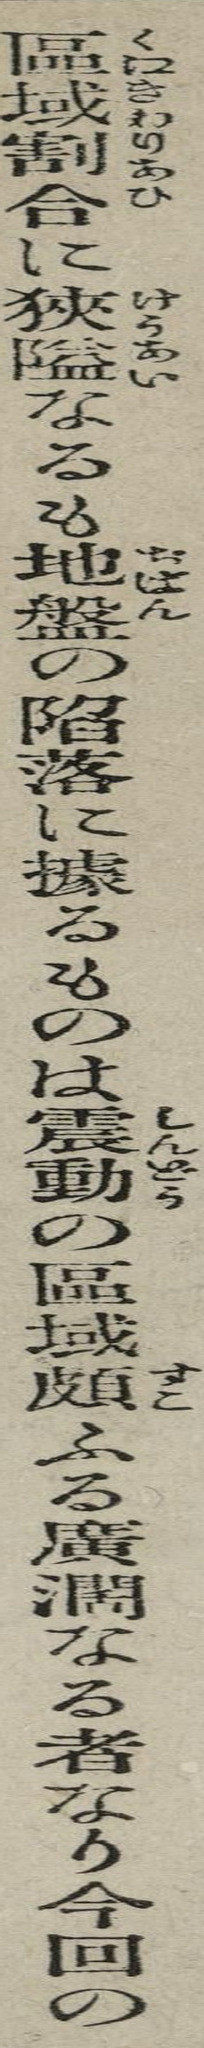區域割合に狭隘なるも地盤の陥落に據るものは震動の區域頗ふる廣濶なる者なり今回の
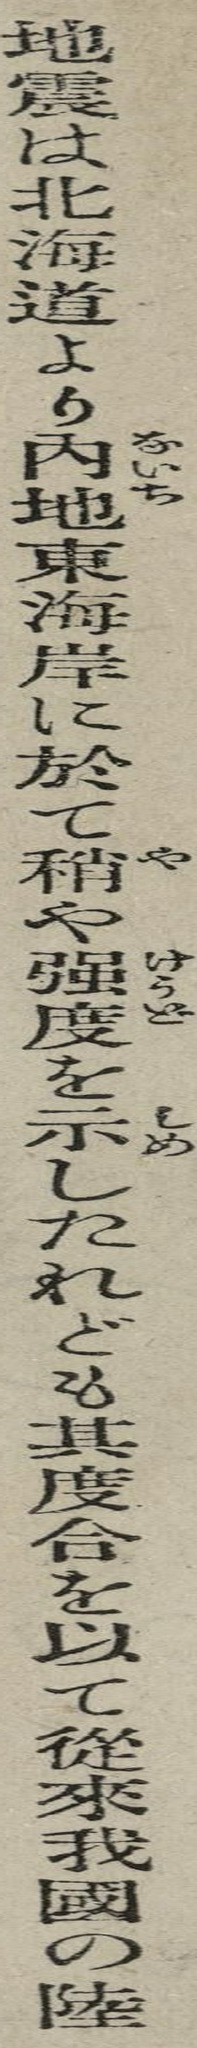地震は北海道より内地東海岸に於て稍や强度を示したれども其度合を以て從來我國の陸

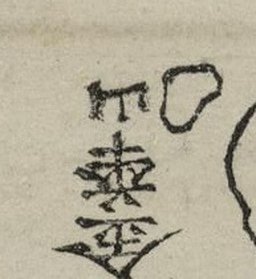金華山
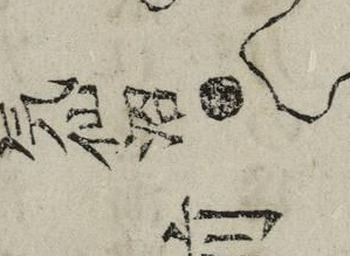気仙沼
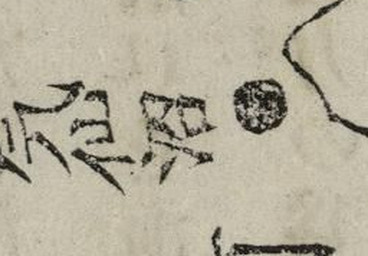気仙沼
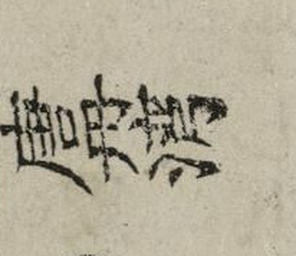唐丹湾

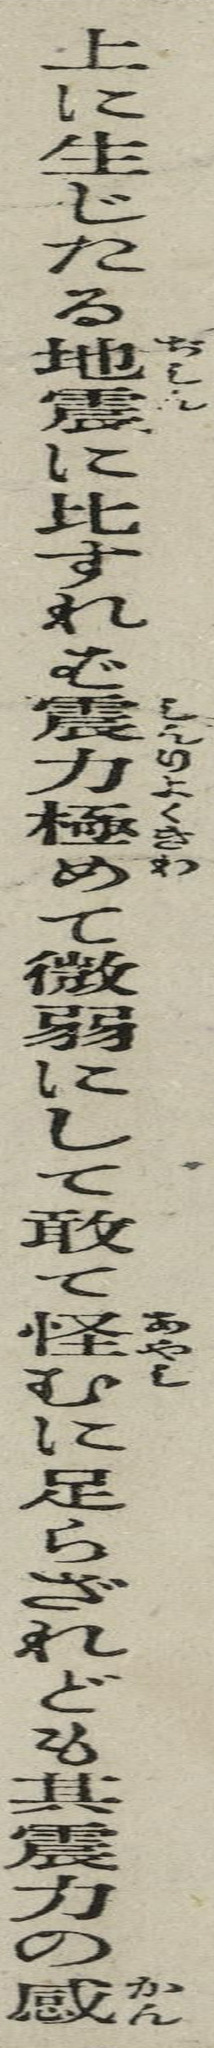上に生じたる地震に比すれば震力極めて微弱にして敢て怪むに足らざれども其震力の感
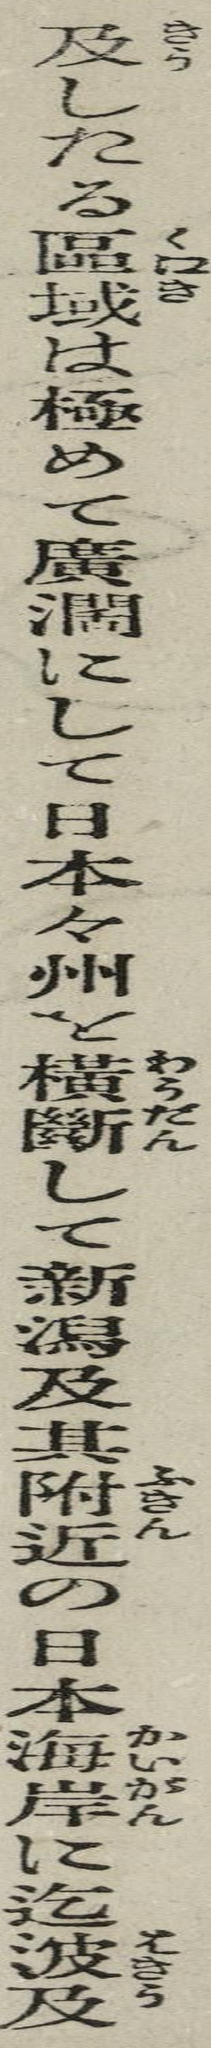及したる區域は極めて廣濶にして日本々州を横斷して新潟及其附近の日本海岸に迄波及
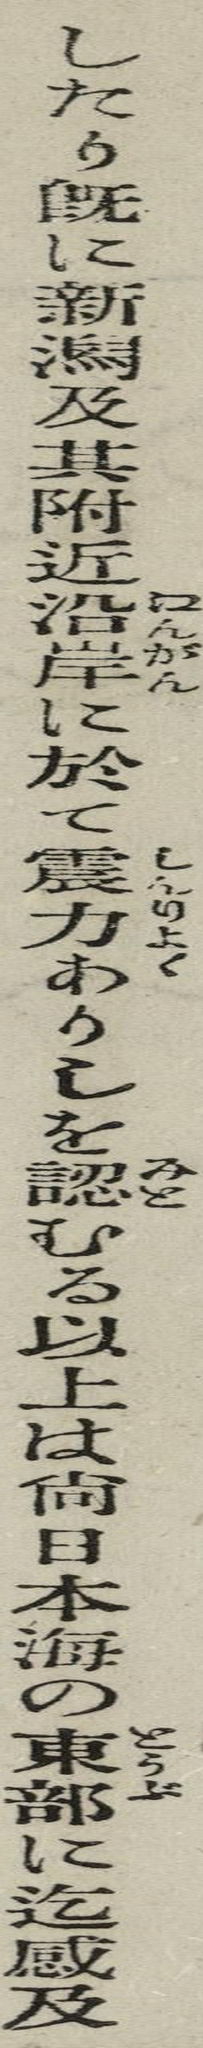したり既に新潟及其附近沿岸に於て震力ありしを認むる以上は尙日本海の東部に迄感及
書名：三陸海嘯細見
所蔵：東京大学地震研究所図書室 Earthquake Research Institute Library, The University of Tokyo, JAPAN
